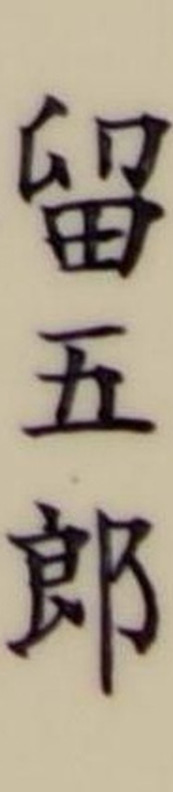留五郎
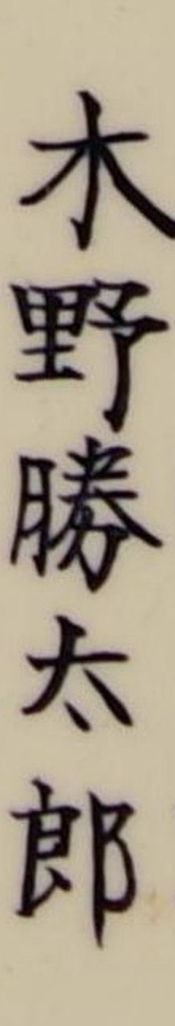木野勝太郎
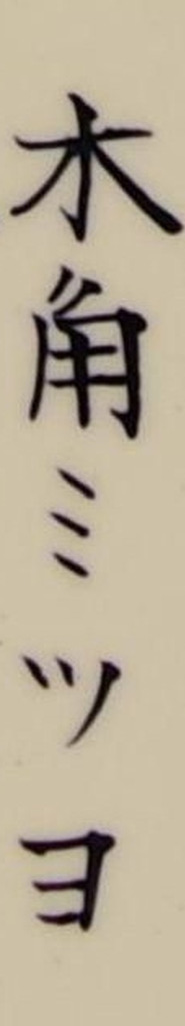木角ミツヨ
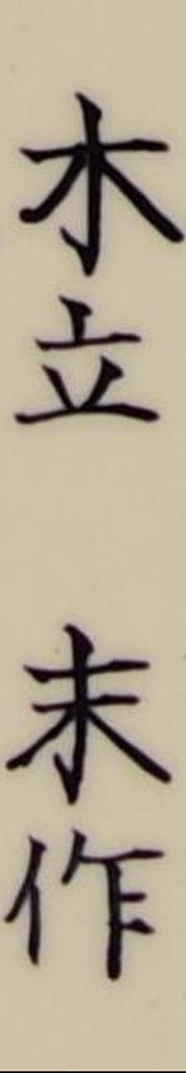木立末作
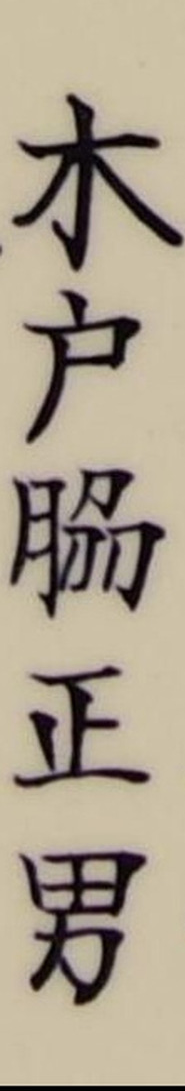木戸脇正男
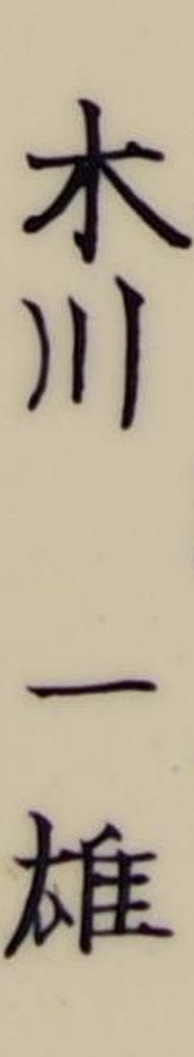木川一雄
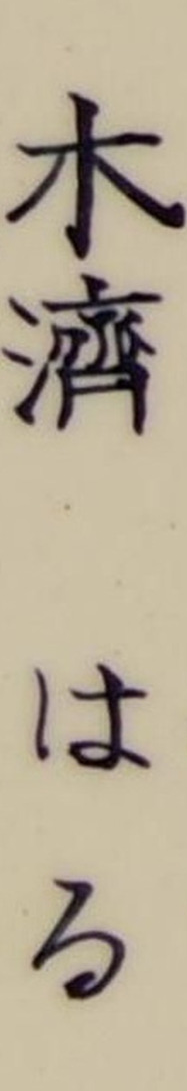木濟はる
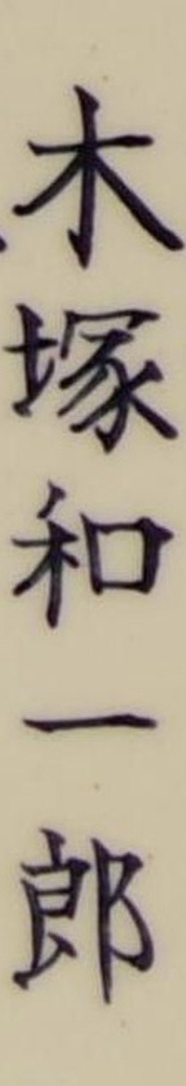木塚和一郎
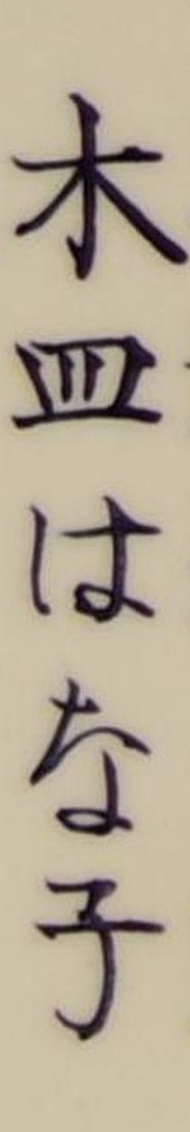木皿はな子
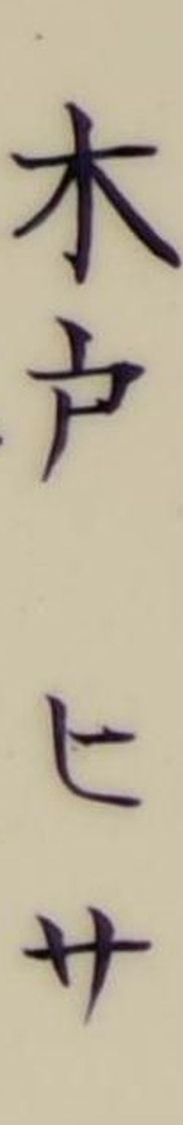木戸ヒサ
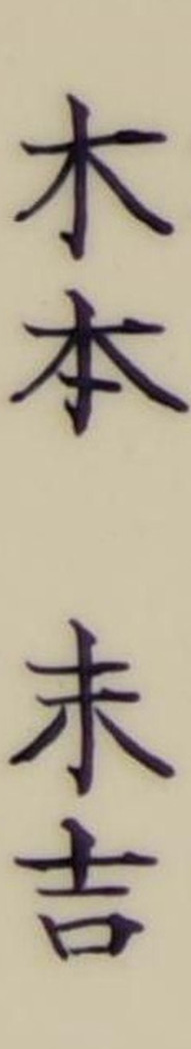木本末吉
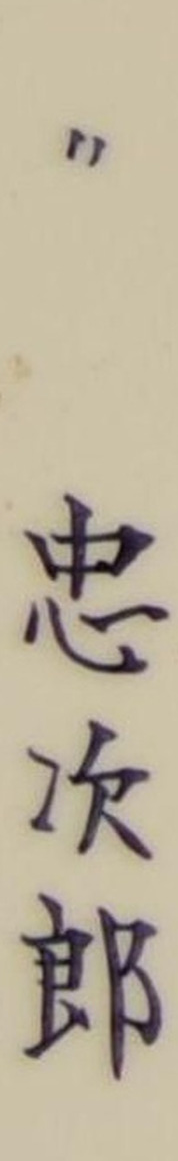忠次郎
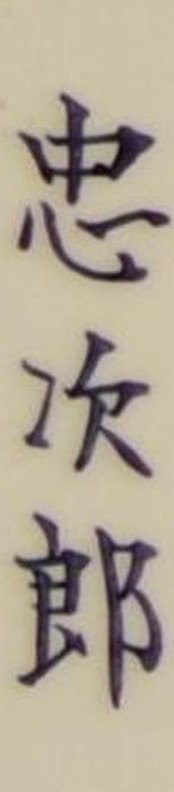忠次郎
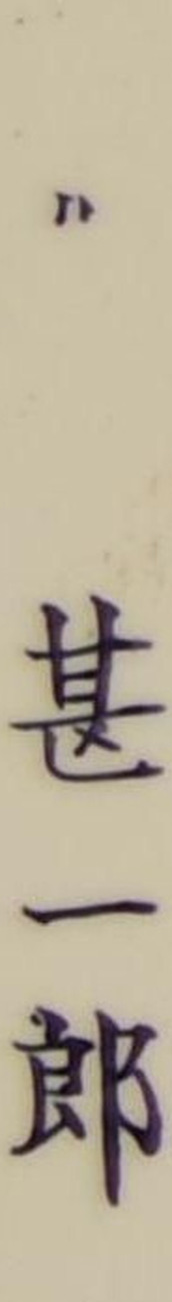甚一郎
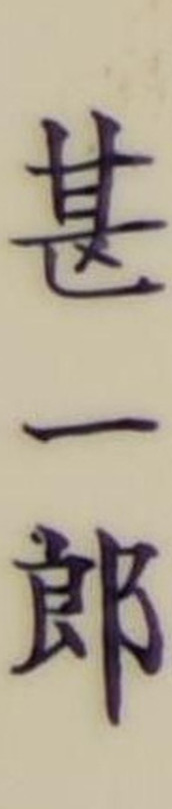甚一郎
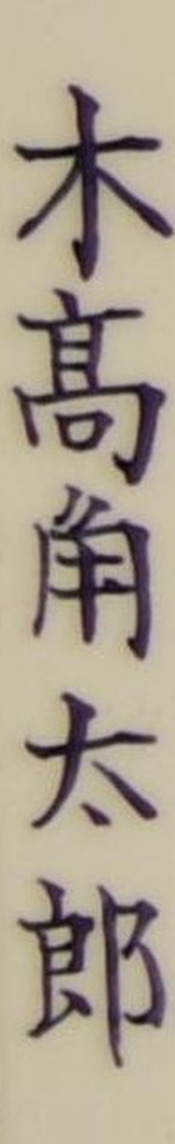木高角太郎
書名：E~L
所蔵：高野山金剛峯寺
